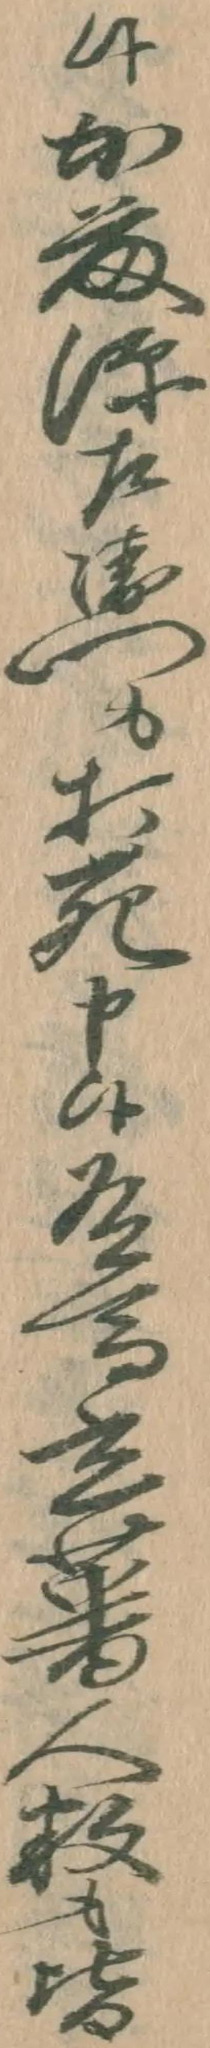候加藤源左衛門も打死申候有馬玄蕃人数も皆
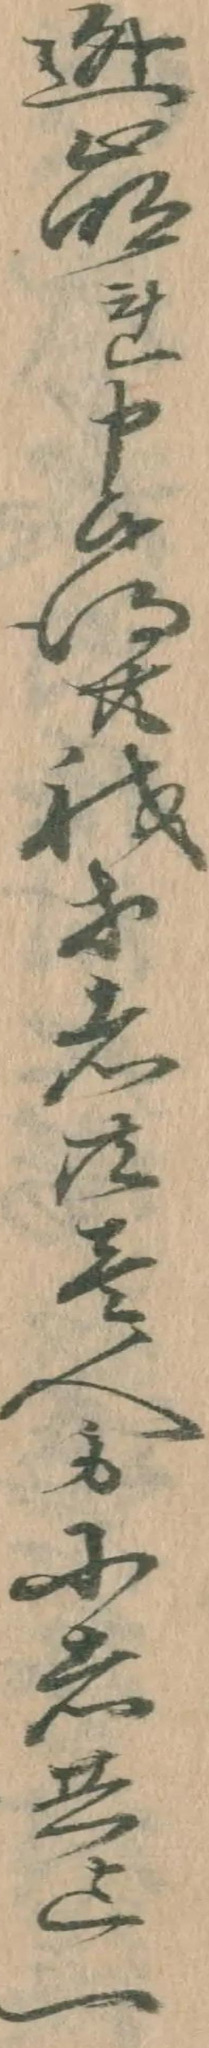逃崩連申候得共我等者共壱人も小者共迄一
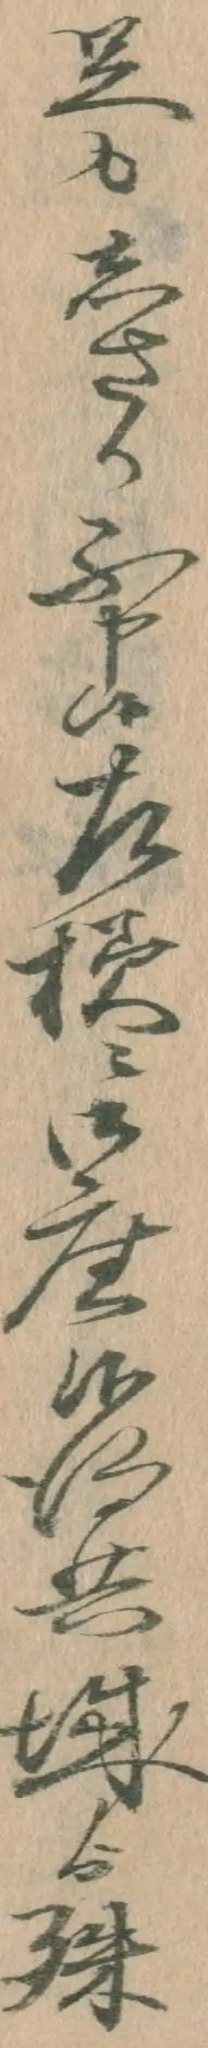足も志さりふ申候左様に御座候得共城ゟ殊
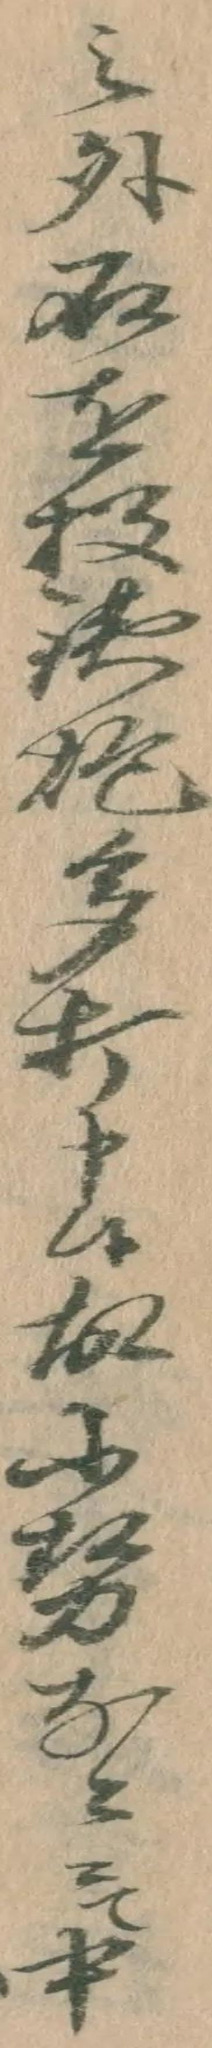之外石を投鉄砲多打申候故小勢なとにて中
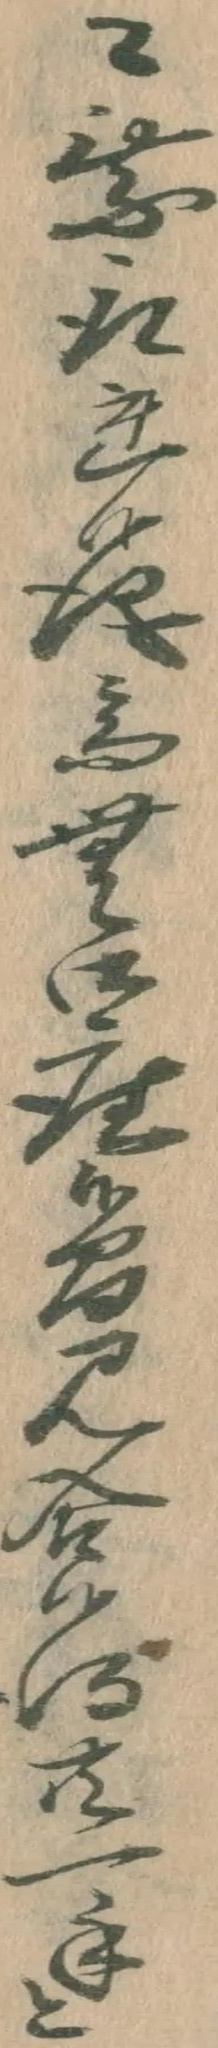々乗取連候儀に而無御座候間見合候得共一手と
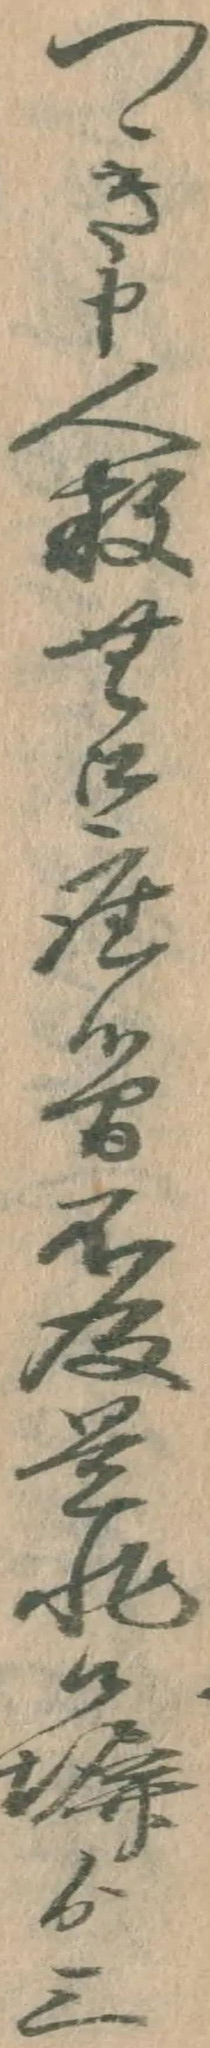つゝき申人数無御座候間不及是非候塀ゟ三
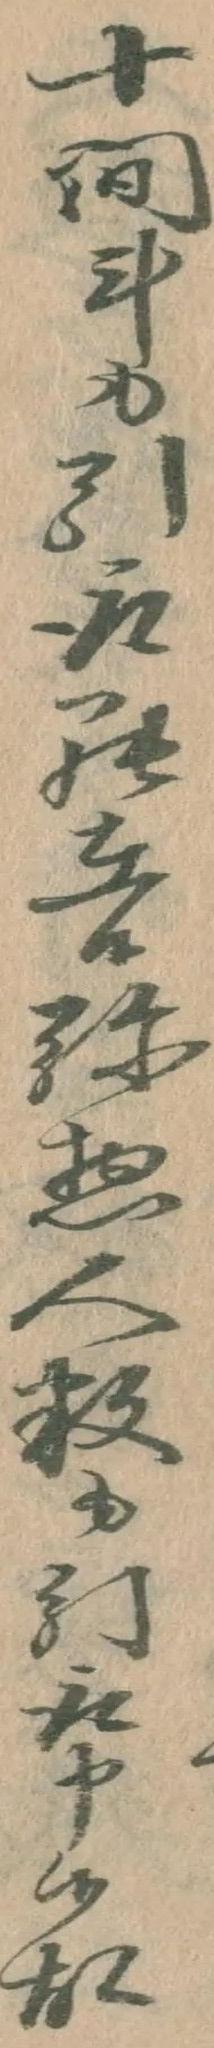十間斗も引取罷在候弥惣人数も引取申候故
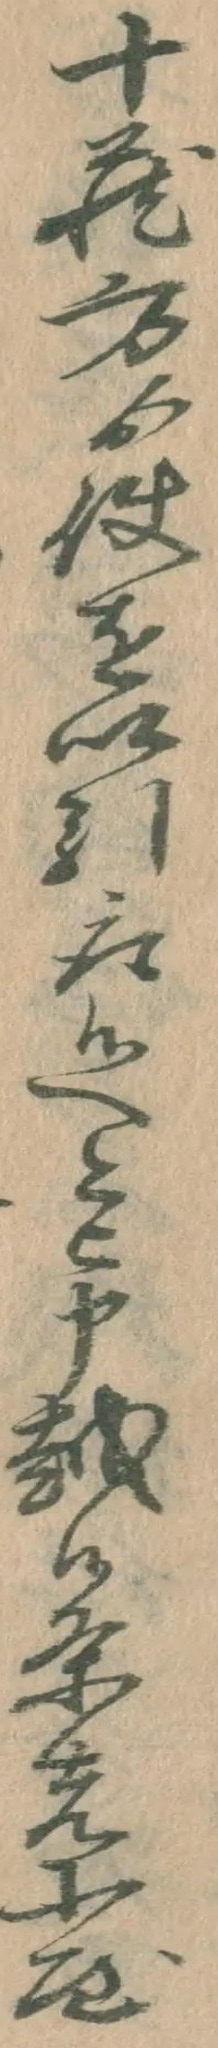十蔵方ゟ使を以引取候へと被申越候条先小屋
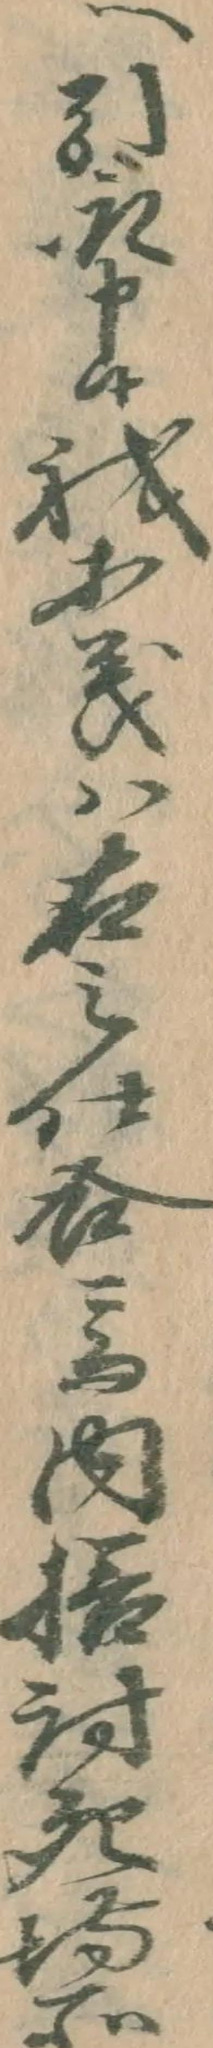へ引取申候我等義は右之仕合に而内膳討死場所
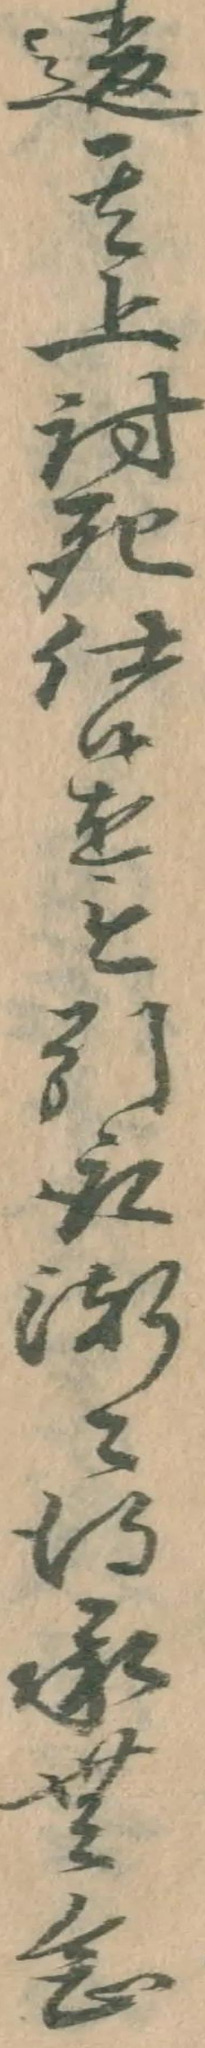違其上討死仕候をも引取漸々得承無念

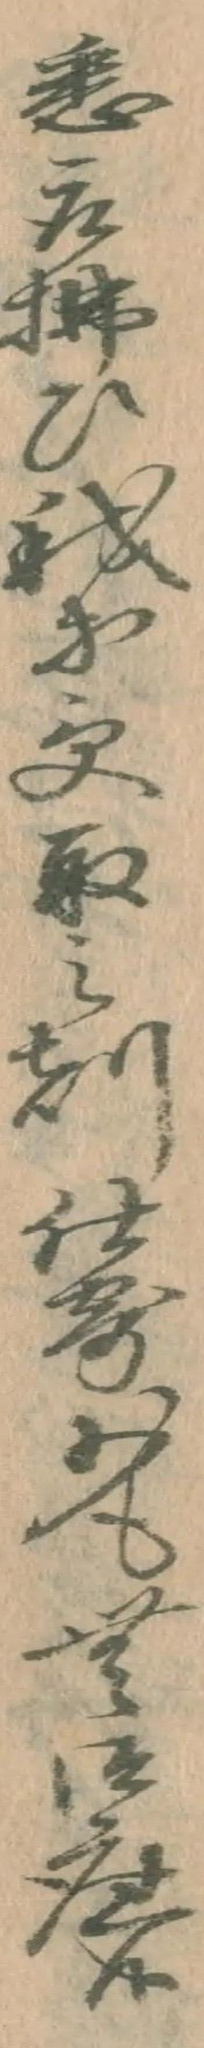悉取払ひ我等受取之刻仕寄少も無御座候
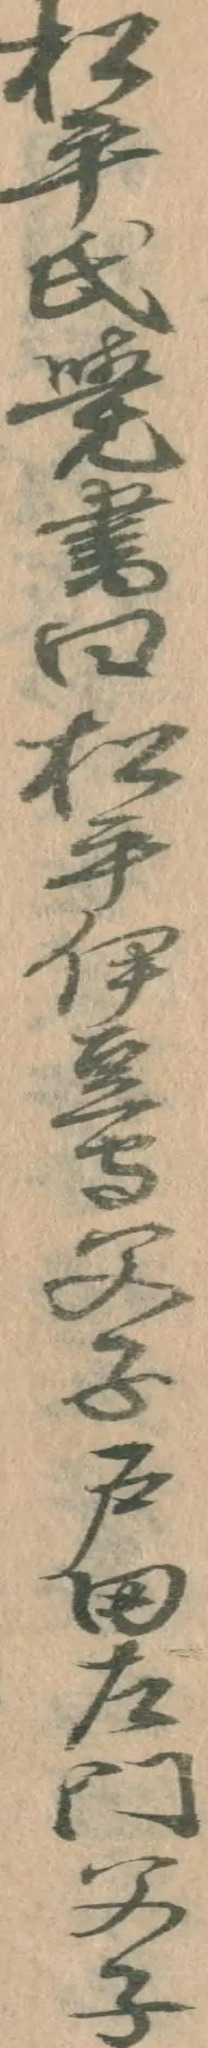松平氏覚書曰松平伊豆守父子戸田左門父子
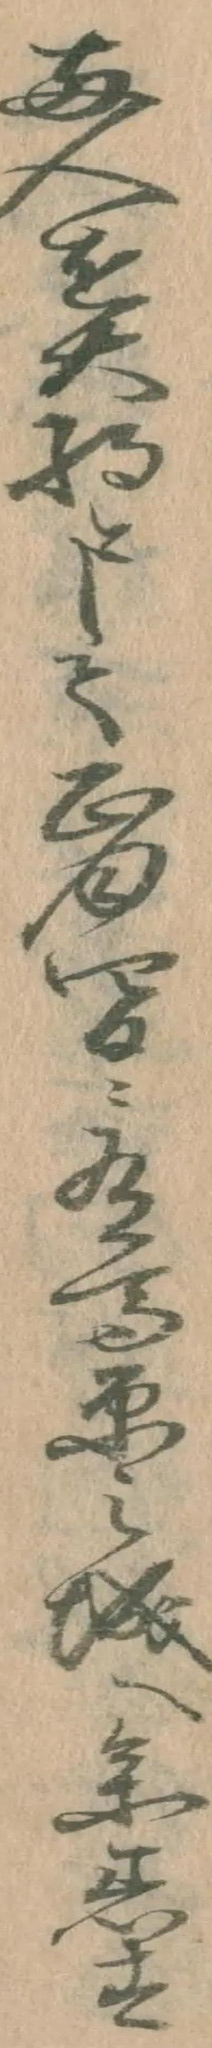両人を大将として正月四日に有馬原之城へ参着春
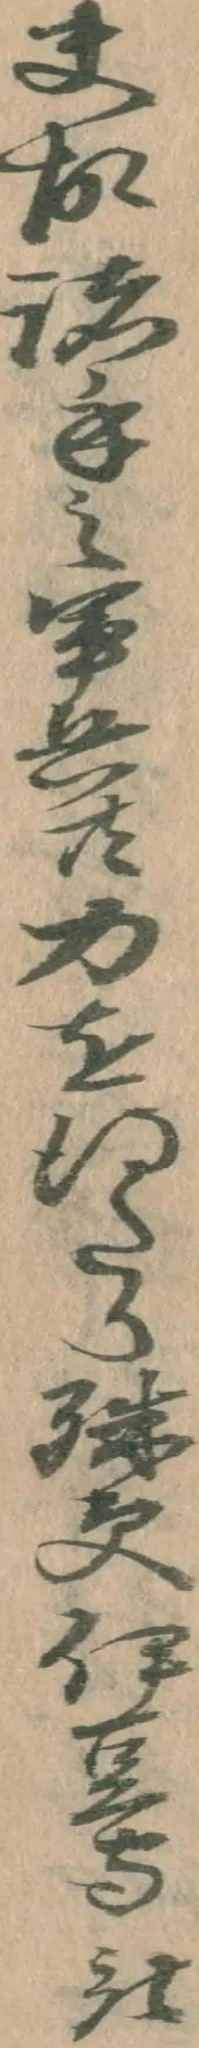夫故諸手之軍兵共力を得たり殊更伊豆守被
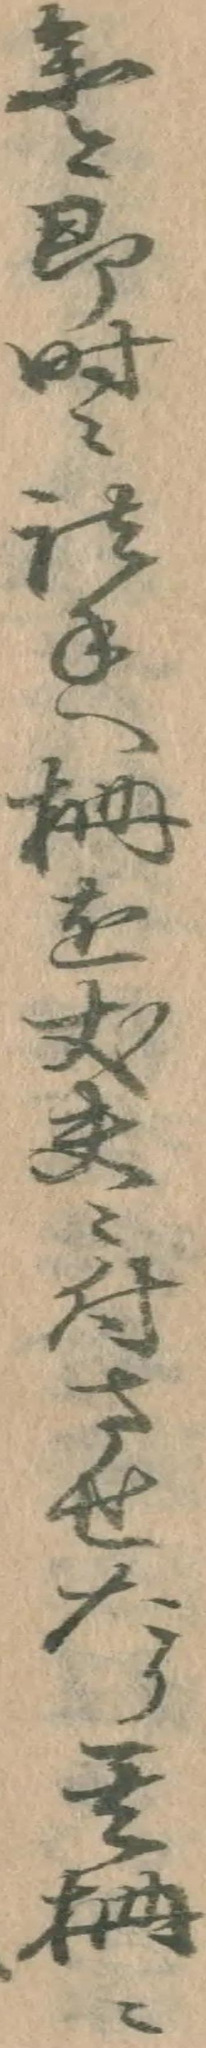参と即時に諸手へ柵を丈夫に付させたり其柵に
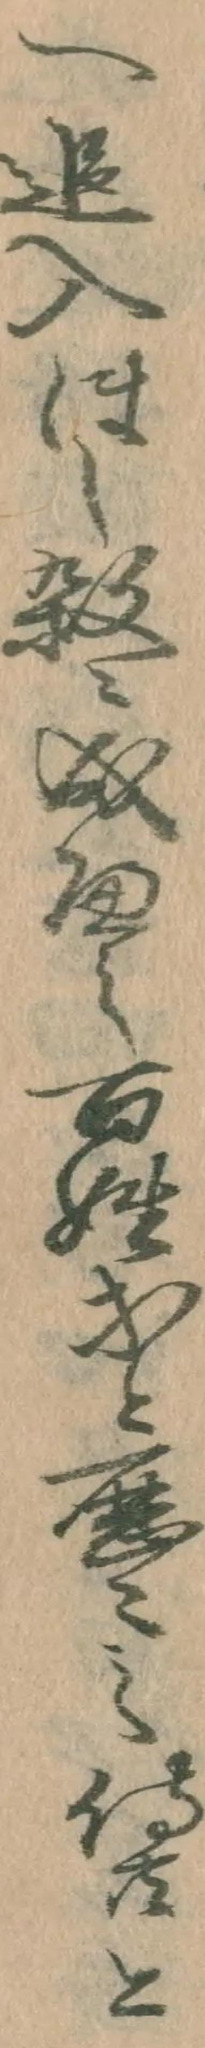へ追入使し殺に成扁し百姓等と歴々之侍共と
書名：切支丹御退治記 49巻. [5]
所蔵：国立国会図書館 National Diet Library, JAPAN
